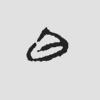白
